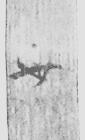卅
